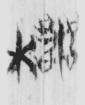櫮
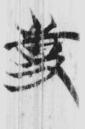事
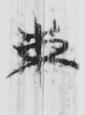東
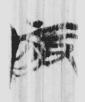{戶攴}
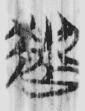遺
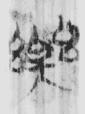樂
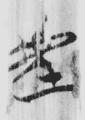𫊟
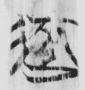迖
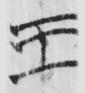王
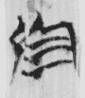於
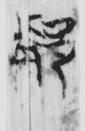{葛阝}
